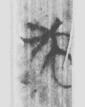求
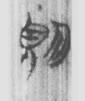{見勿}
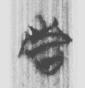青
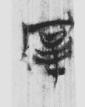厚
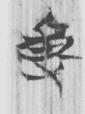尃
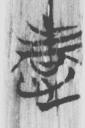𢝬
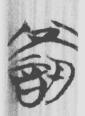罰
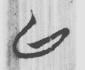㠯（以）
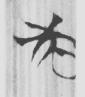求
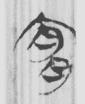宜
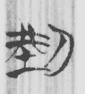型
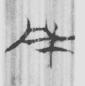凡
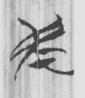民
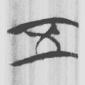五
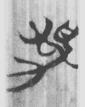爭
